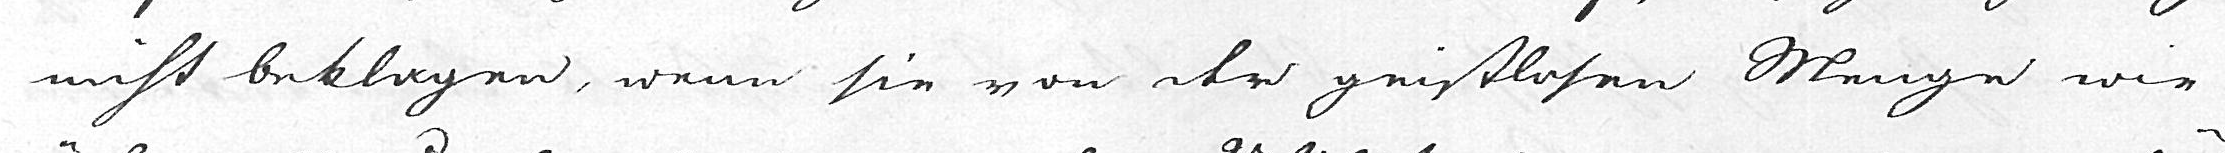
nicht beklagen, wenn sie von der geistlosen Menge wir
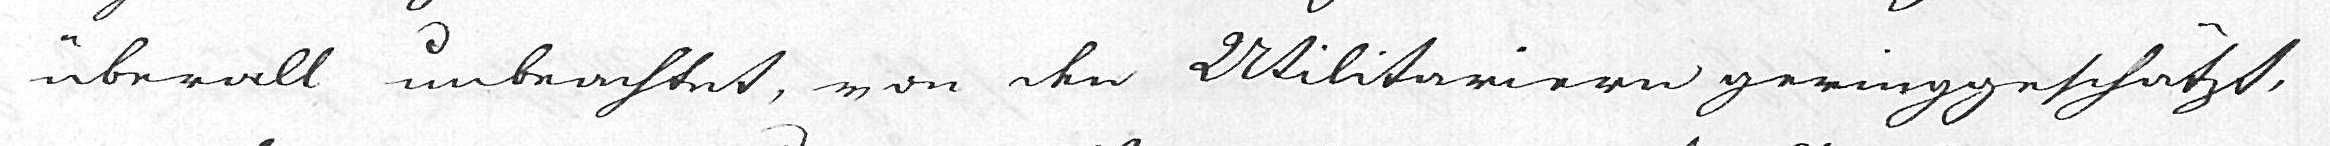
überall unbeachtet, von den Utilitariern geringgeschätzt,
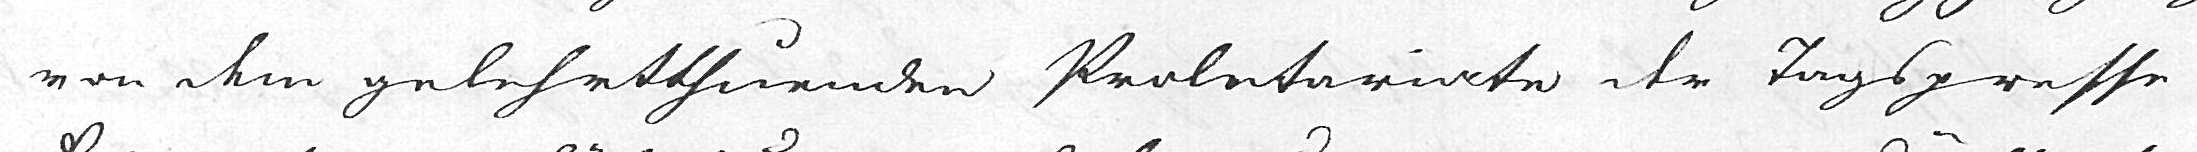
von dem gelehrtthuenden Proletariate der Tagspresse-
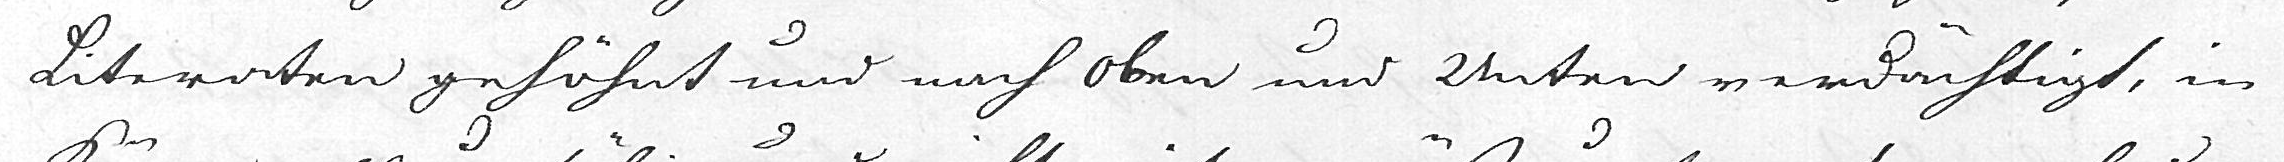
Literaten gehöhnt und nach Oben und Unten verdächtigt, in
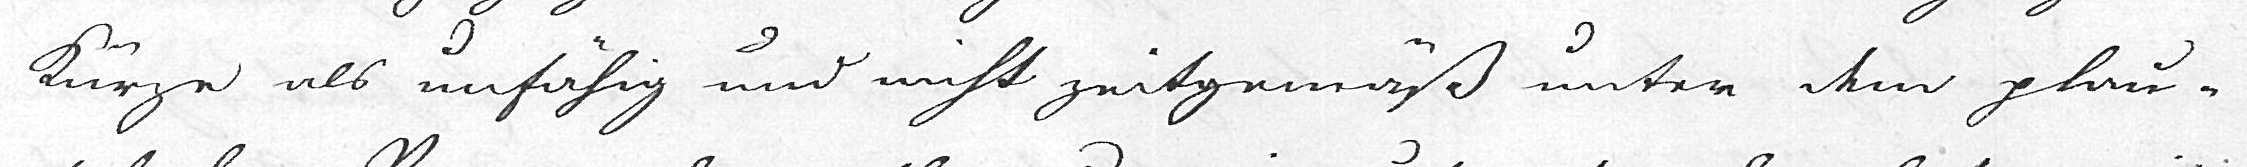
Kürze als unfähig und nicht zeitgemäß unter dem plau-
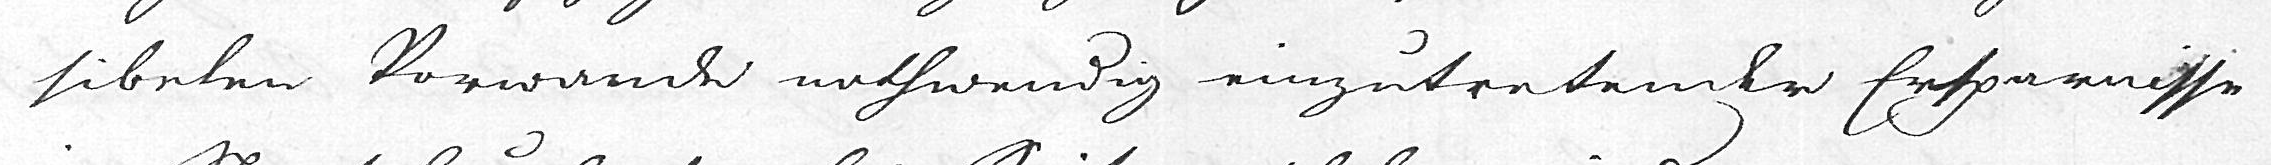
sibelen Vorwande nothwendig einzutretender Ersparnisse
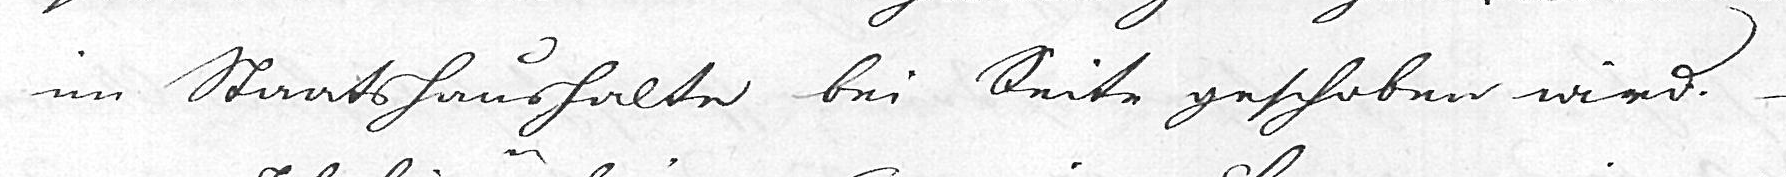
in Staatshaushalte bei Seite geschoben wird.
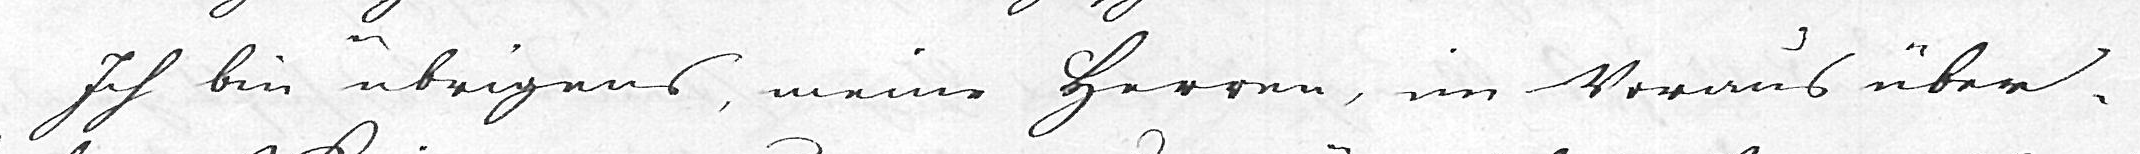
Ich bin übrigens, meine Herren, im Voraus über-
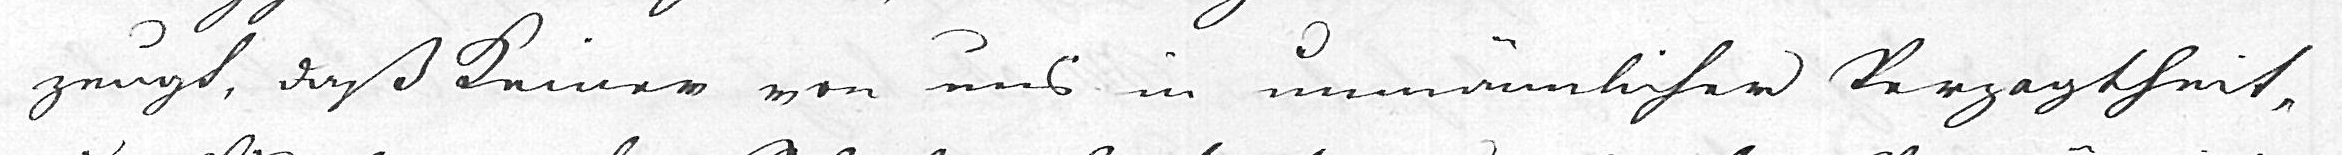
zeugt, daß Keiner von uns in unmännlicher Verzagtheit,
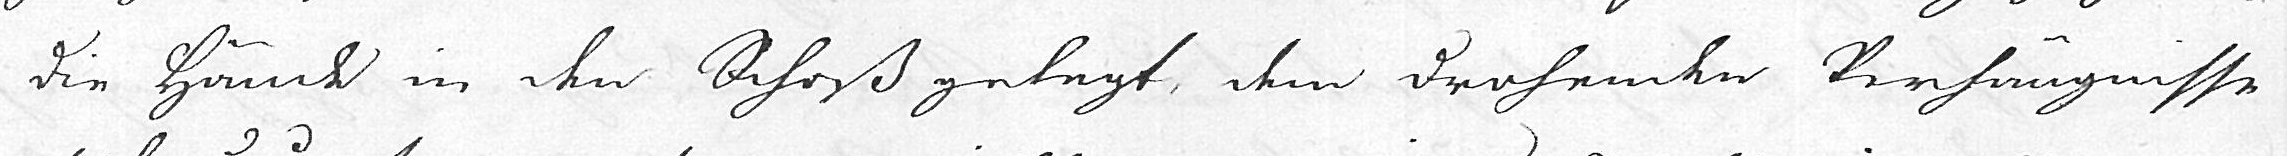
die Hände in den Schoß gelegt, dem drohenden Verhängnisse
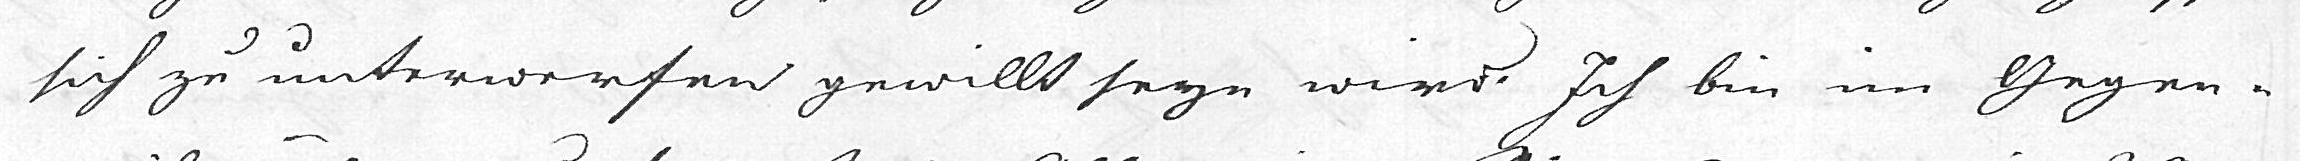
sich zu unterwerfen gewillt seyn wird. Ich bin im Gegen-
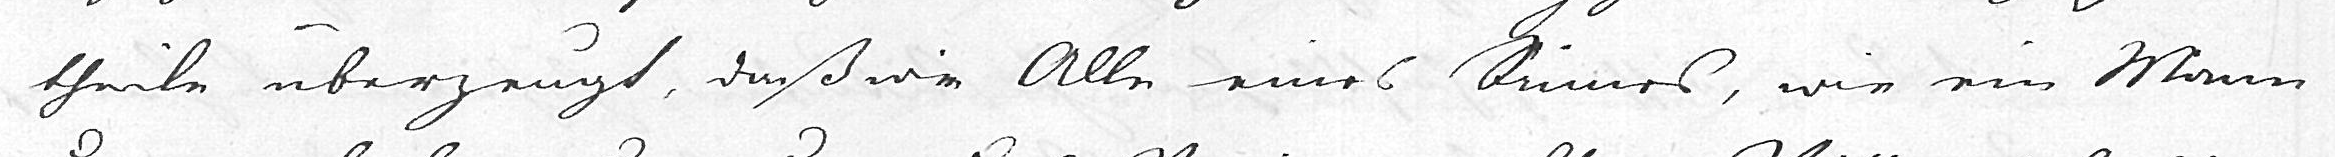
theile überzeugt, daß wir Alle eines Sinnes, wie ein Mann
